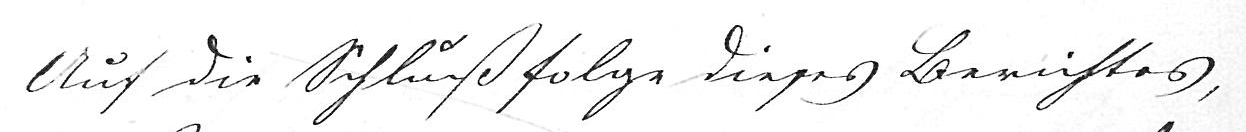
Auf die Schlußfolge dieses Berichtes,
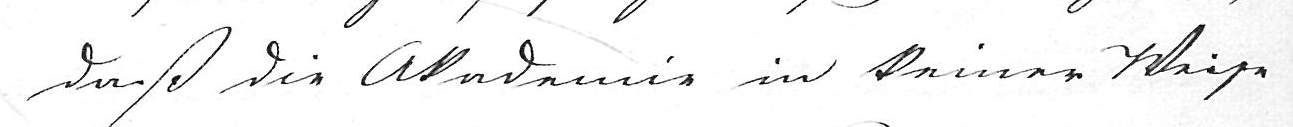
daß die Akademie in keiner Weise
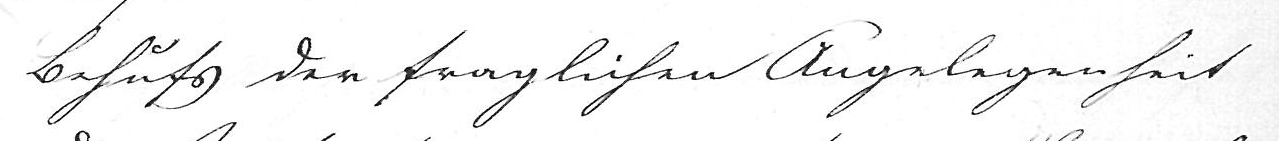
behufs der fraglichen Angelegenheit
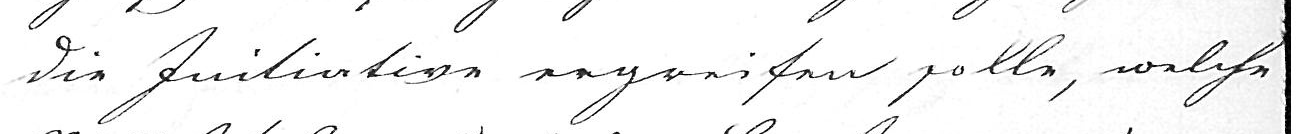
die Initiative eingreifen solle, welche
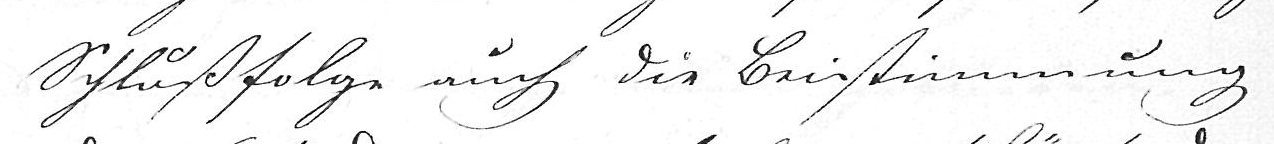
Schlußfolge auch die Beistimmung
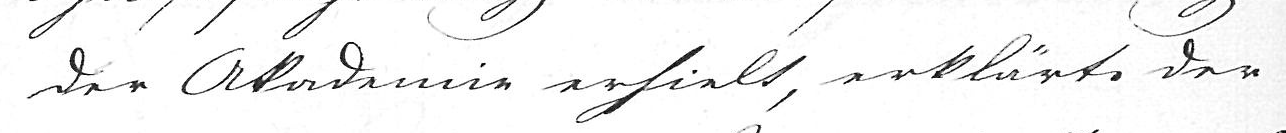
der Akademie erhielt, erklärte der
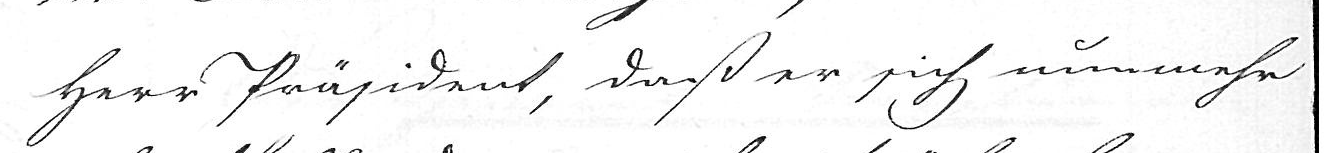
Herr Präsident, daß er sich nunmehr
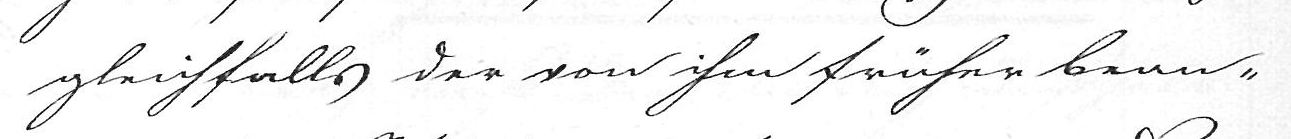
gleichfalls der von ihm früher bean-
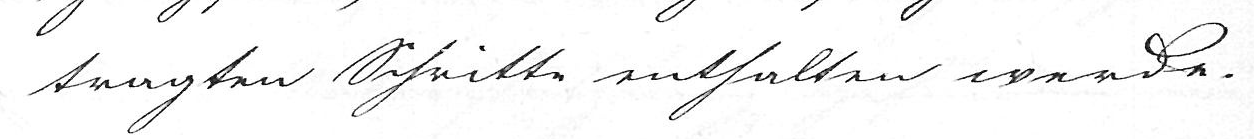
tragten Schritte enthalten werde.
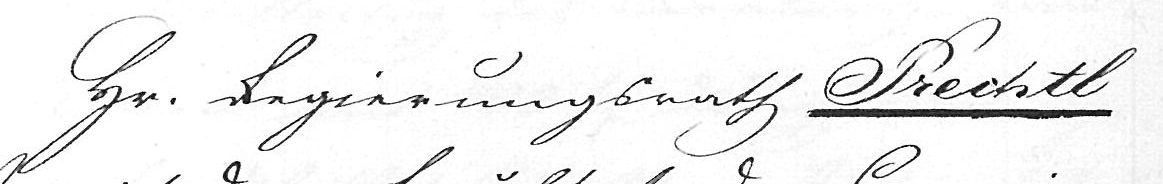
Hr. Regierungsrath Prechtl
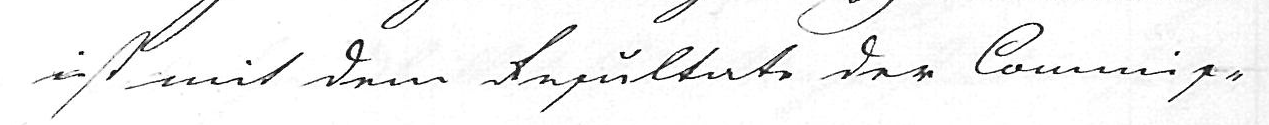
ist mit dem Resultat der Comis-
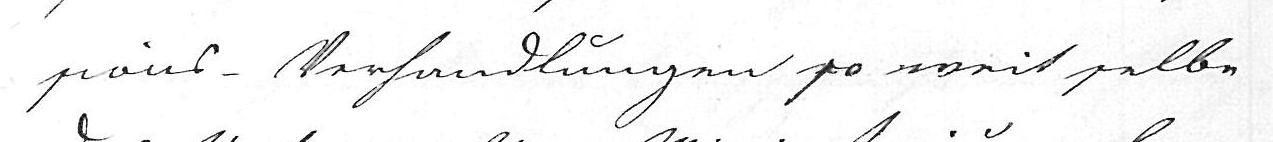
sions-Verhandlungen so weit selbe
